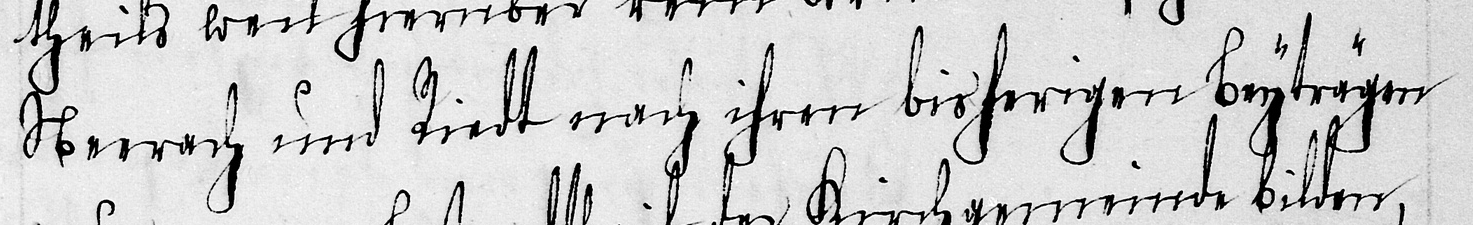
Neerach und Riedt nach ihren bisherigen Beyträgen
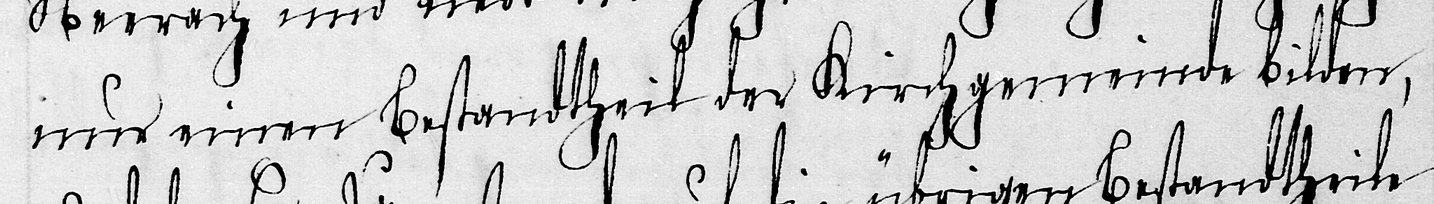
nur einen Bestandtheil der Kirchgemeinde bilden,
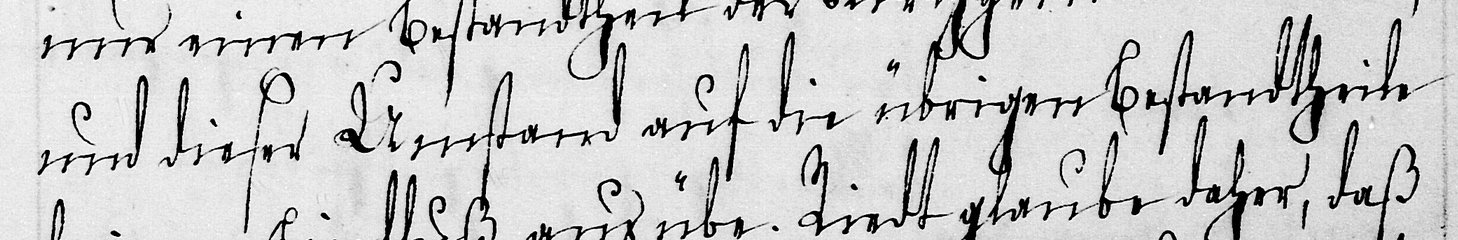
und dieser Umstand auf die übrigen Bestandtheile
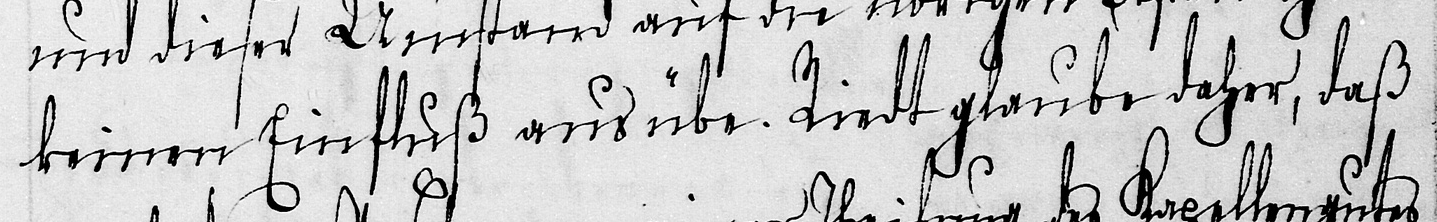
keinen Einfluß ausübe. Riedt glaube daher, daß
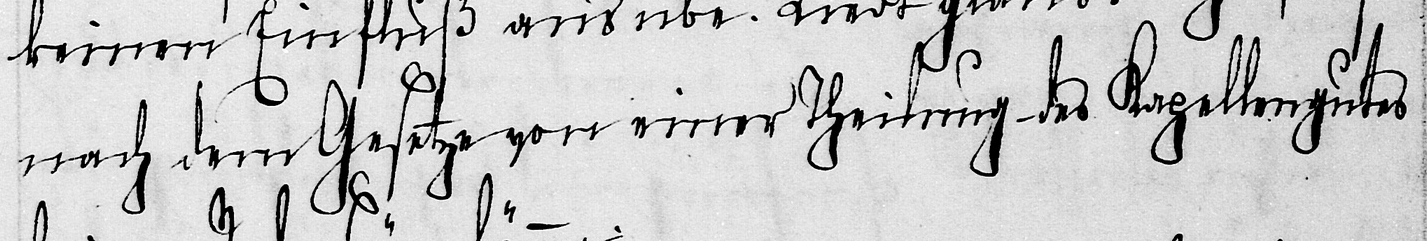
nach dem Gesetze von einer Theilung des Kapellengutes
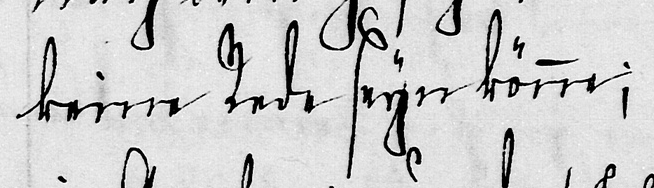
keine Rede seyn könne;
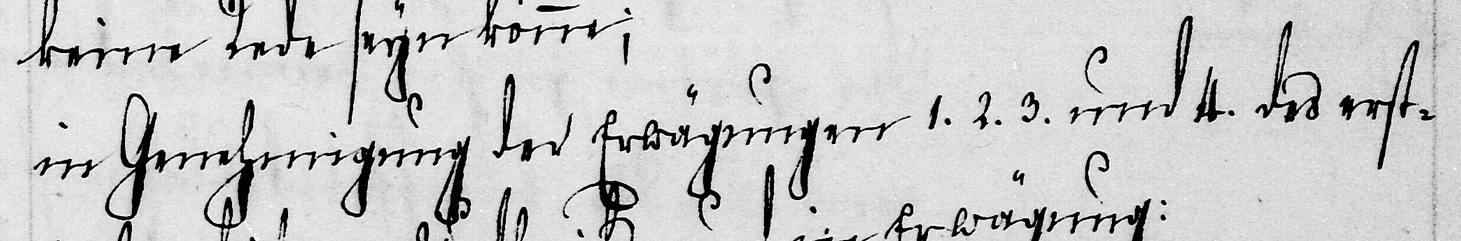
in Genehmigung der Erwägung 1. 2. 3. und 4. des erst¬
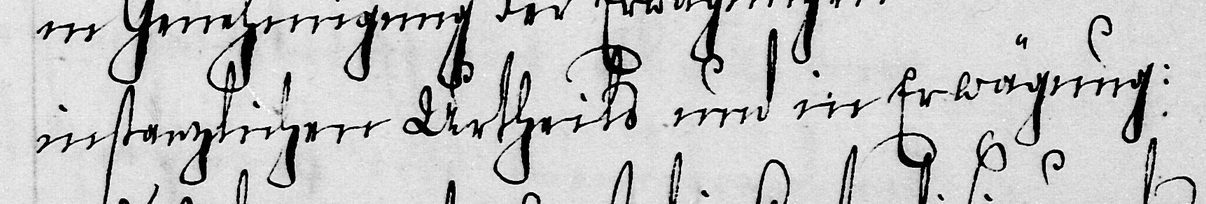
instanzlichen Urtheils und in Erwägung:
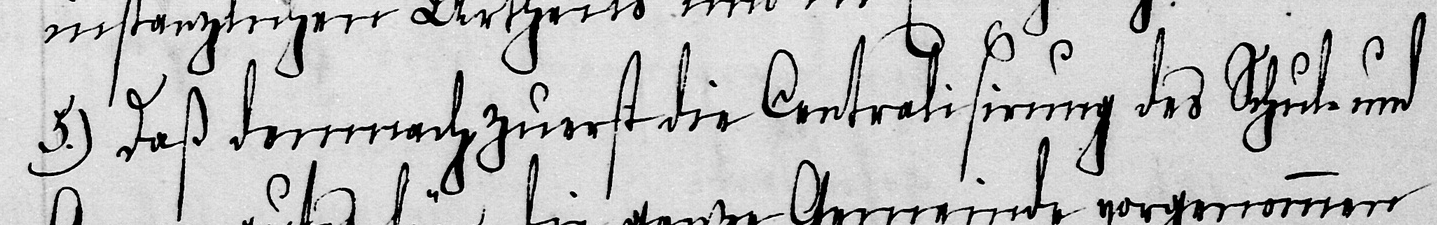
5.) Daß demnach zuerst die Centralisirung des Schul- und
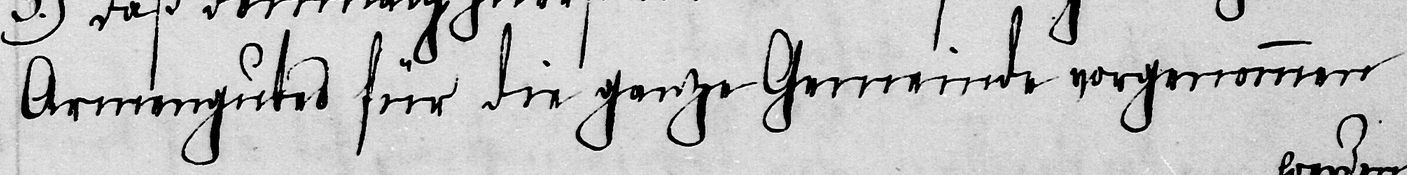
Armengutes für die ganze Gemeinde vorgenommen
